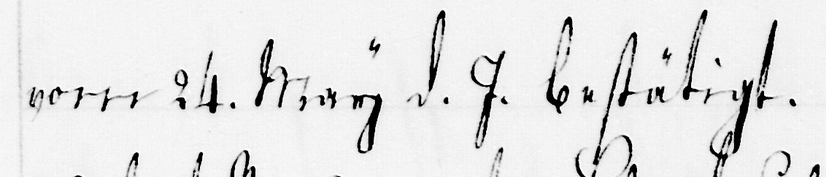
vom 24. May d. J. bestätigt.
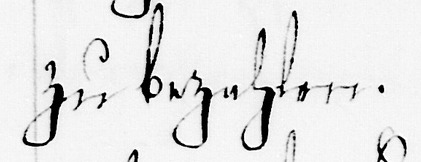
zu bezahlen.
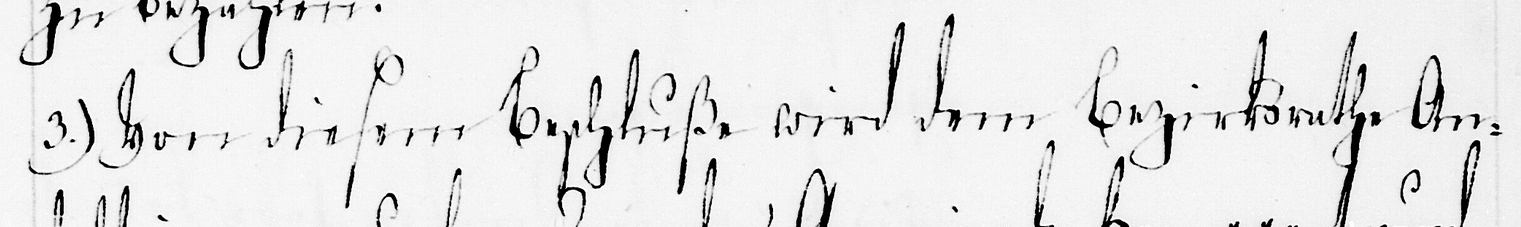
3.) Von diesem Beschluße wird dem Bezirksrathe An¬
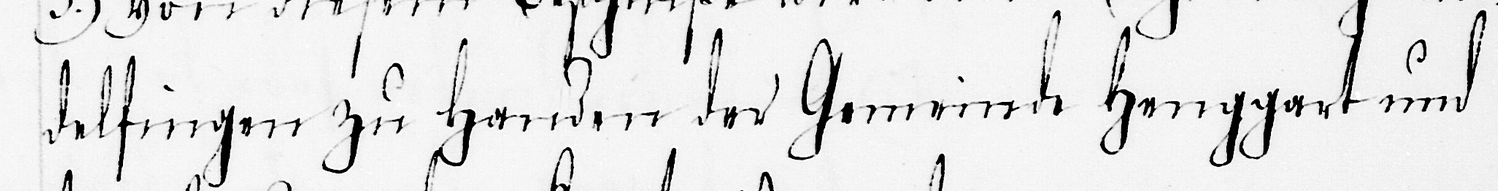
delfingen zu Handen der Gemeinde Henggart und
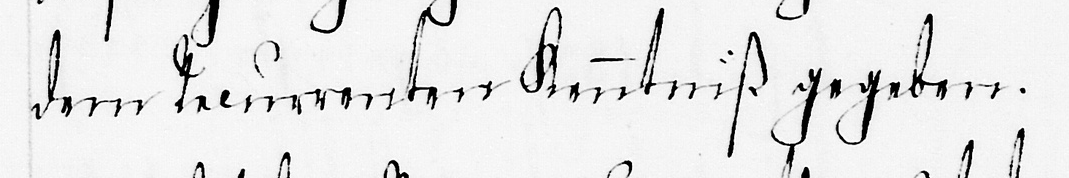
dem Recurrenten Kenntniß gegeben.
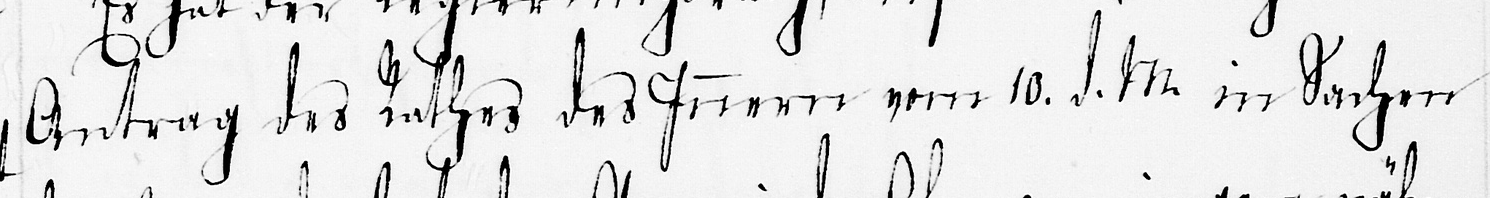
Antrag des Rathes des Innern vom 10. d. M. in Sachen
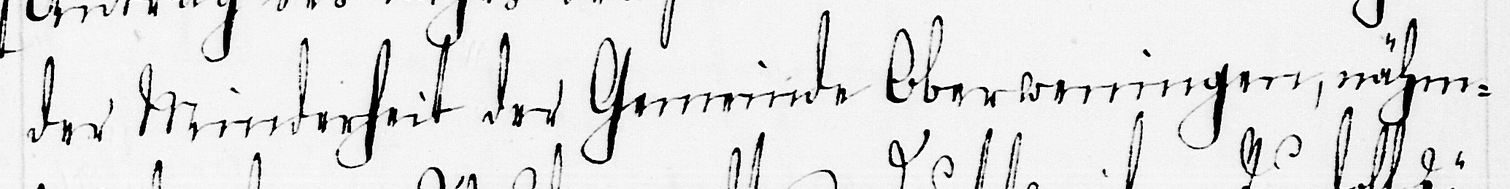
der Minderheit der Gemeinde Oberweningen, nähm¬
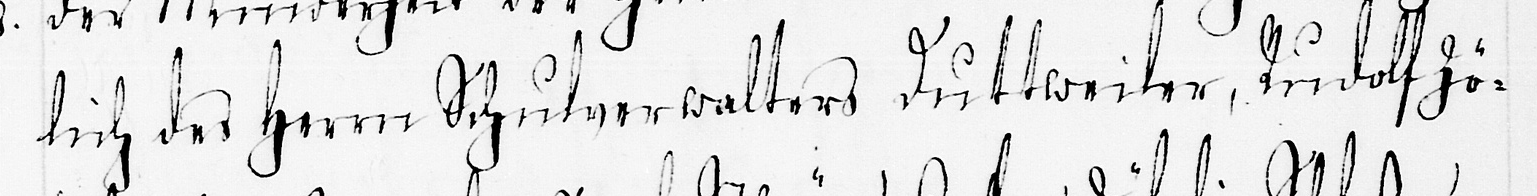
lich des Herrn Schulverwalters Duttweiler, Rudolf Zö¬
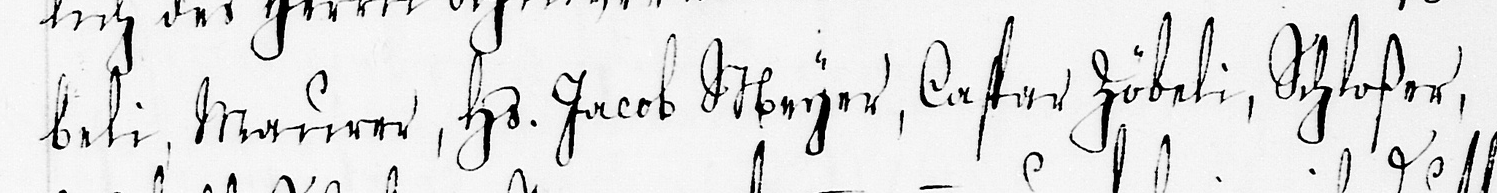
beli, Maurer, Hs. Jacob Meyer, Caspar Zöbeli, Schloßer,
